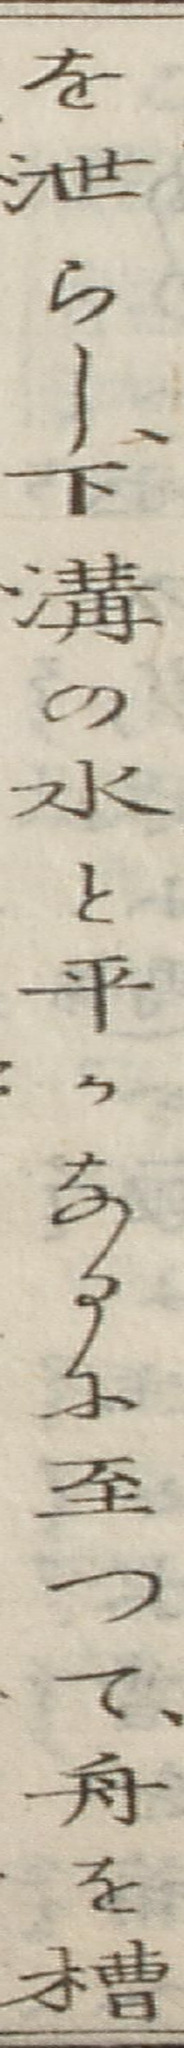を泄らし、下溝の水と平かなるに至つて、舟を槽
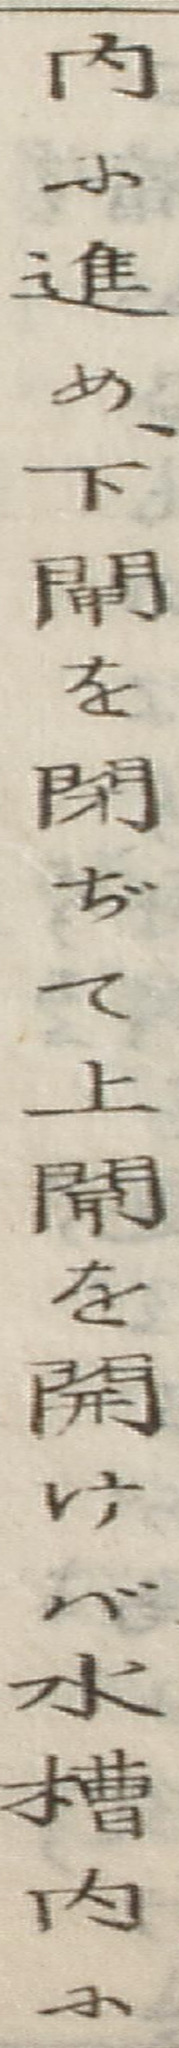内に進め、下閘を閉ぢて上閘を開けば、水槽内に
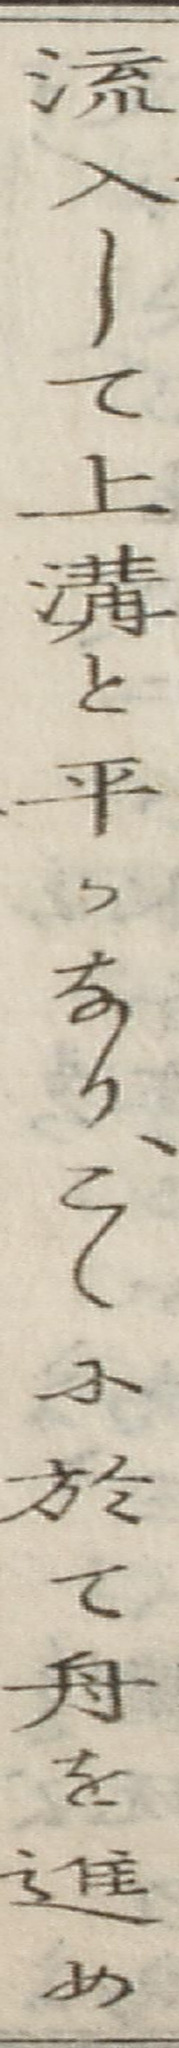流入して上溝と平かなり、こゝに於て舟を進め
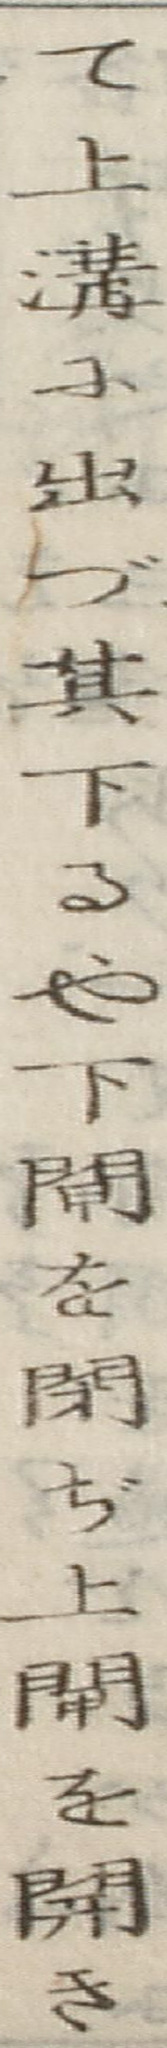て上溝に出づ、其下るや下閘を閉ぢ上閘を開き、
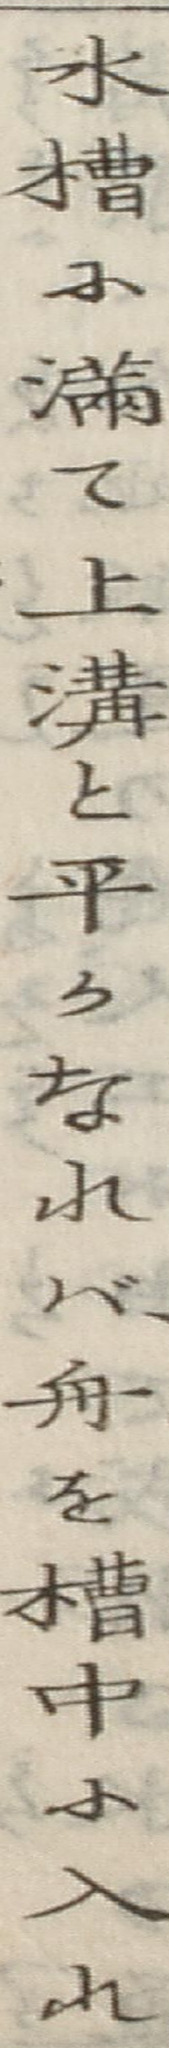水槽に満て、上溝と平かなれば、舟を槽中に入れ、
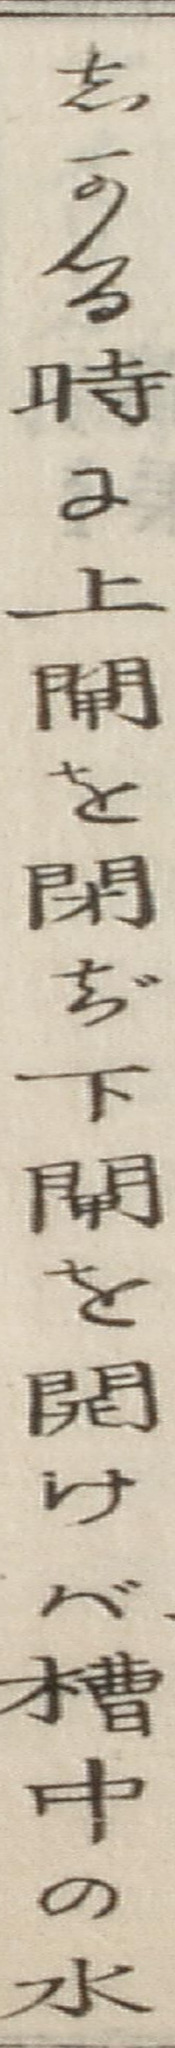しかる時に上閘を閉ぢ下閘を開けば、槽中の水
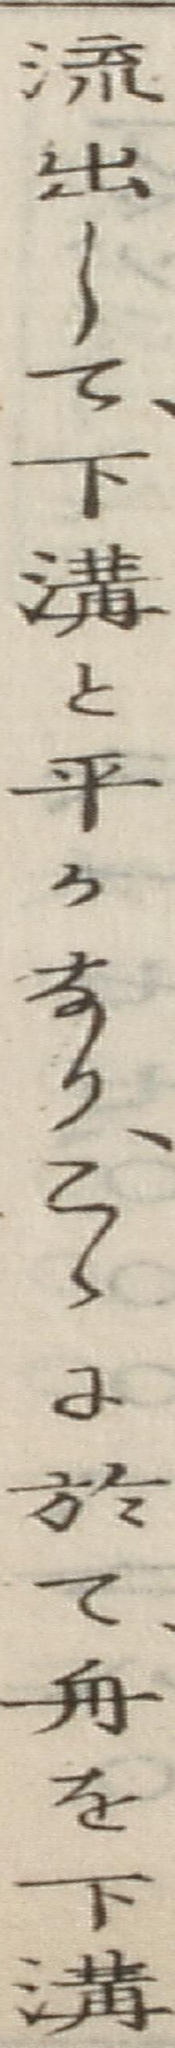流出して、下溝と平かなり、こゝに於て、舟を下溝
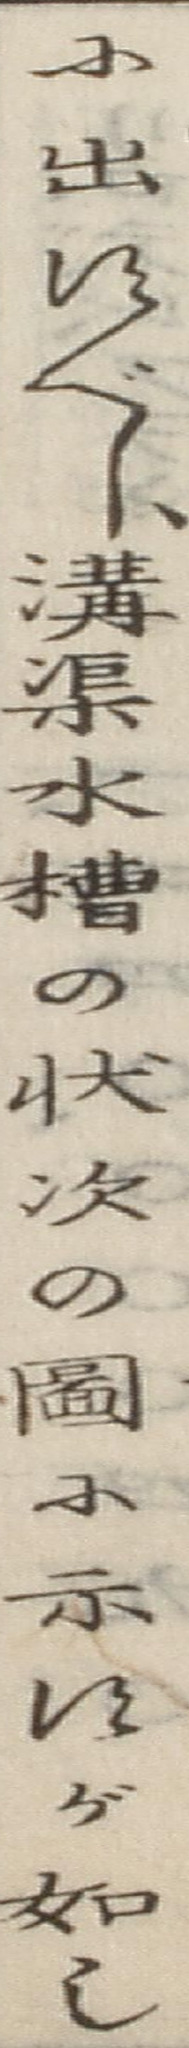に出すべし、溝渠水槽の状次の図に示すが如し

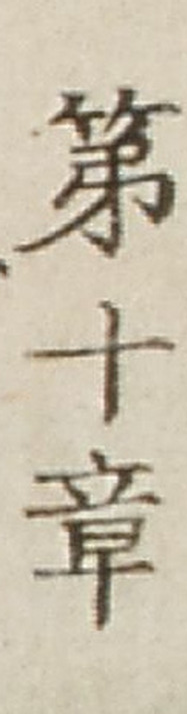第十章
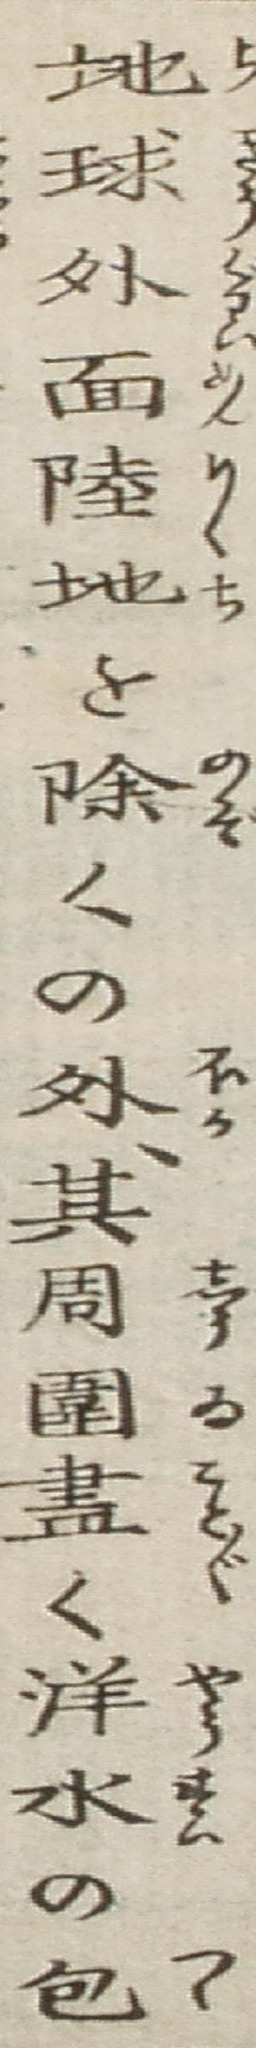地球外面陸地を除くの外、其周囲尽く洋水の包
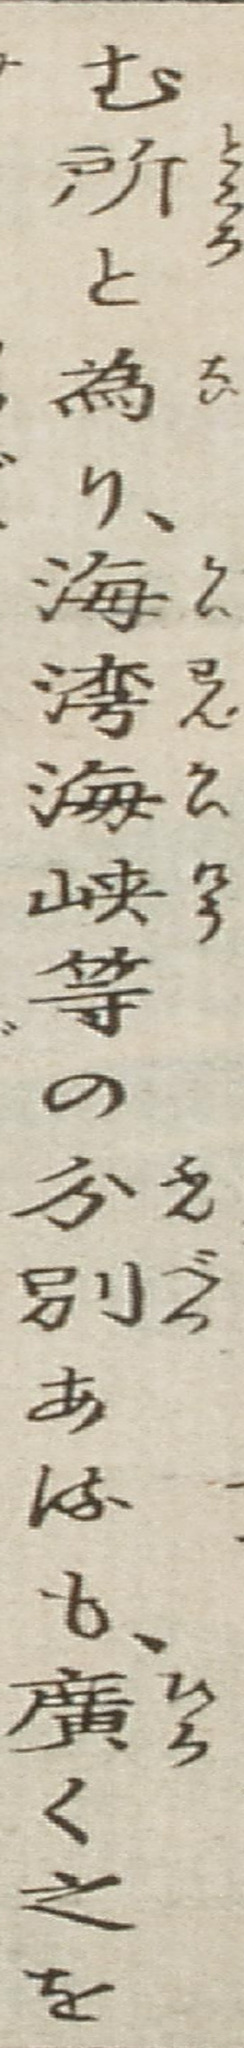む所と為り、海湾海峡等の分別あるも、広く之を
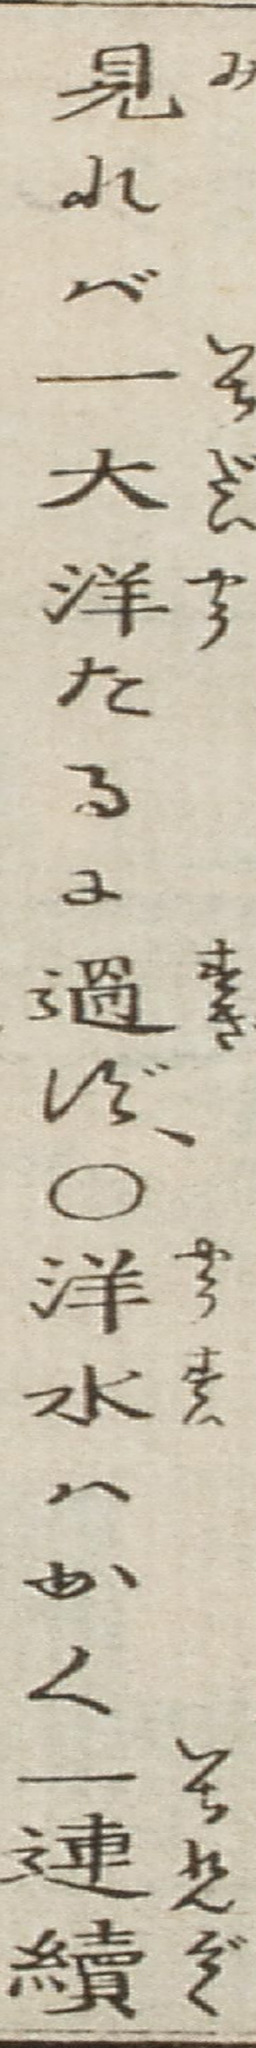見れば一大洋たるに過ず、○洋水はかく一連続
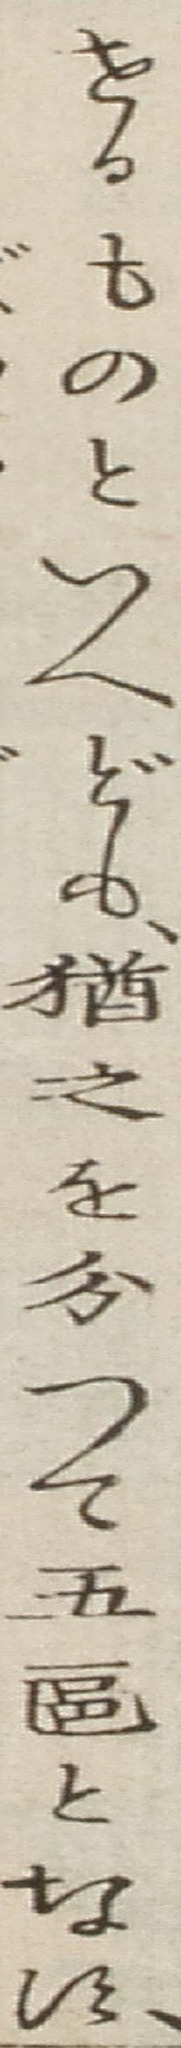せるものといへども、猶之を分つて五区となす、
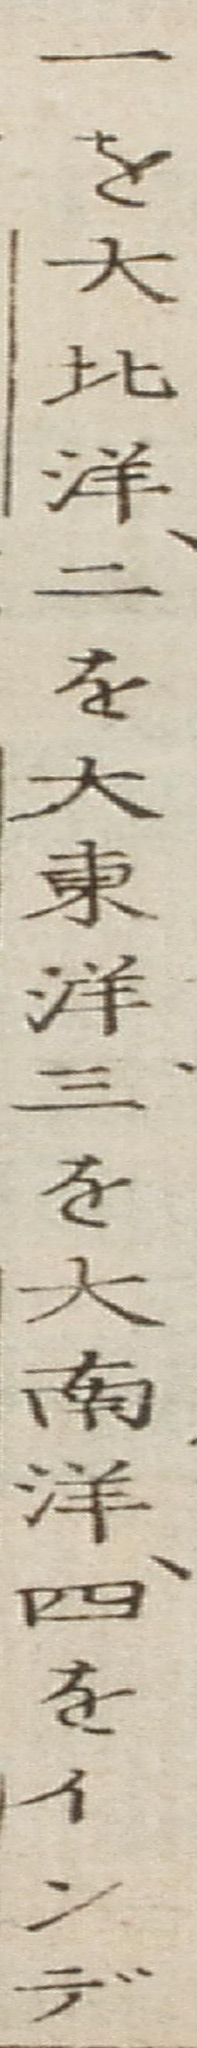一を大北洋、二を大東洋三を大南洋、四をインデ
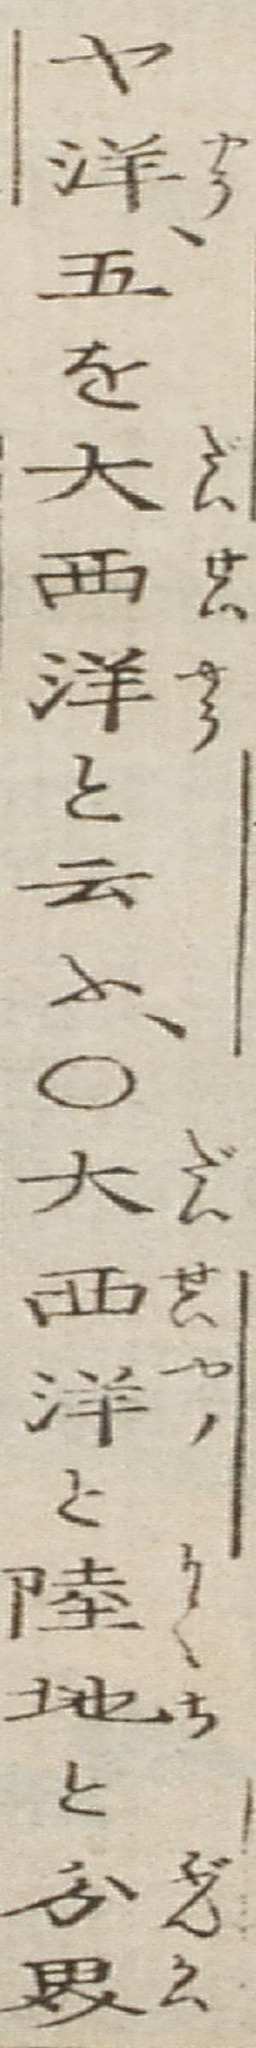ヤ洋、五を大西洋と云ふ、○大西洋と陸地と分界
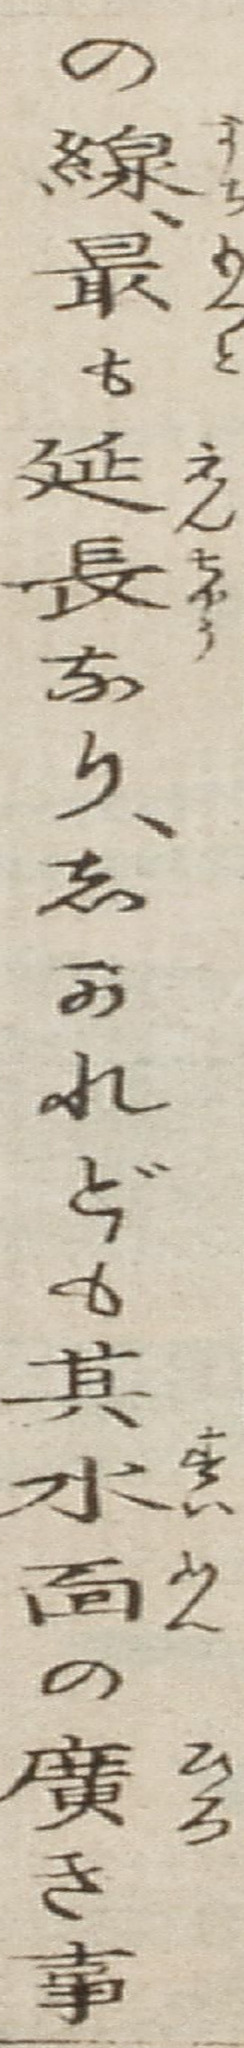の線、最も延長なり、しかれども其水面の広き事
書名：訓蒙　天然地理學　中
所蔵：東京大学地震研究所図書室 Earthquake Research Institute Library, The University of Tokyo, JAPAN
